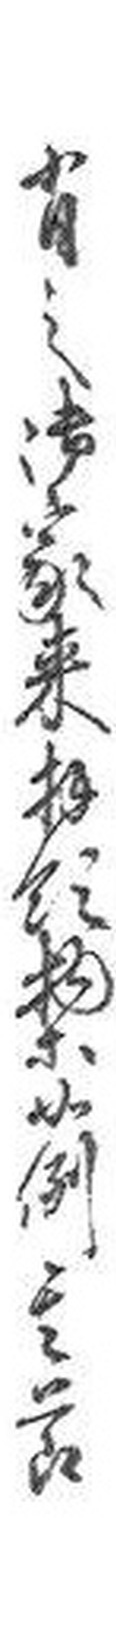有之御家来拝領物等如例其節
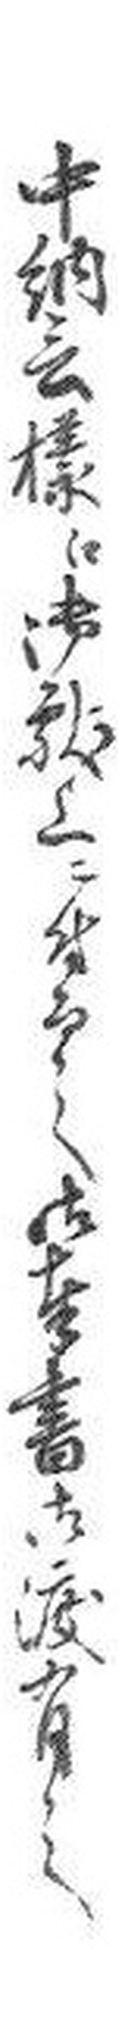中納言様江御献上ニ付而之御奉書御渡有之
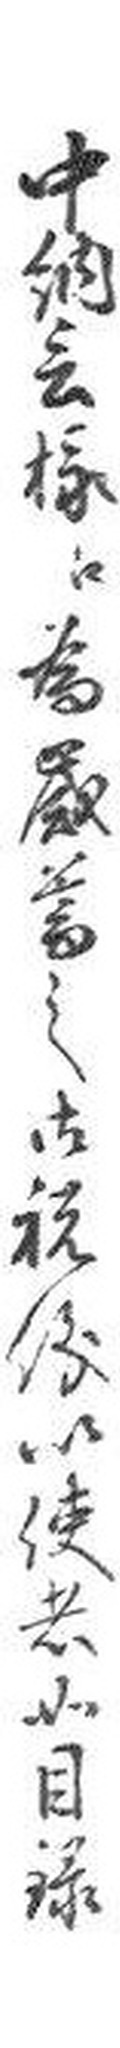中納言様江為歳暮之御祝儀以使者如目録
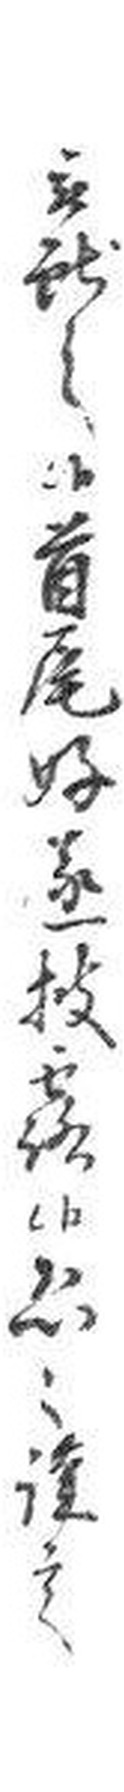被献之候首尾好遂披露候恐々謹言
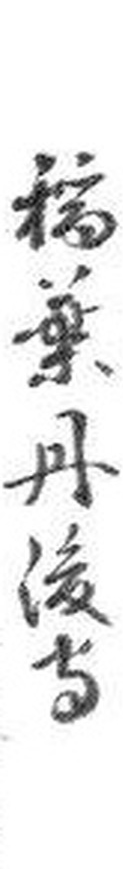稲葉丹後守
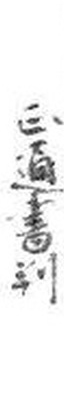正通書判
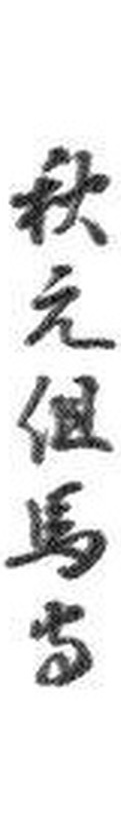秋元但馬守
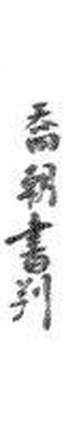喬朝書判
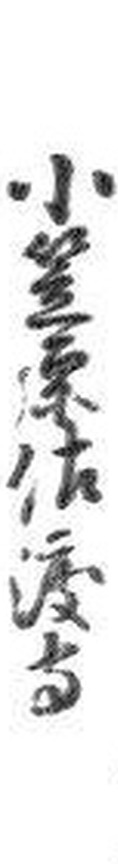小笠原佐渡守
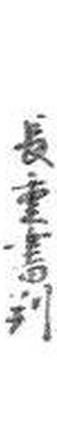長重書判
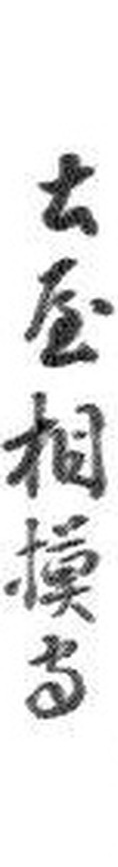土屋相模守
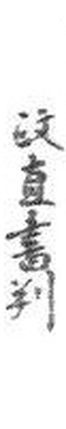政直書判
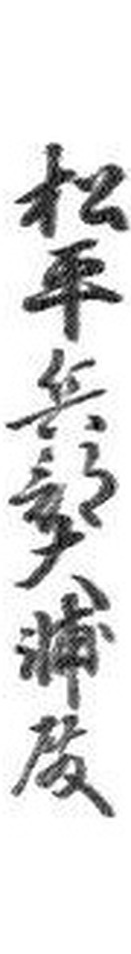松平兵部大輔殿
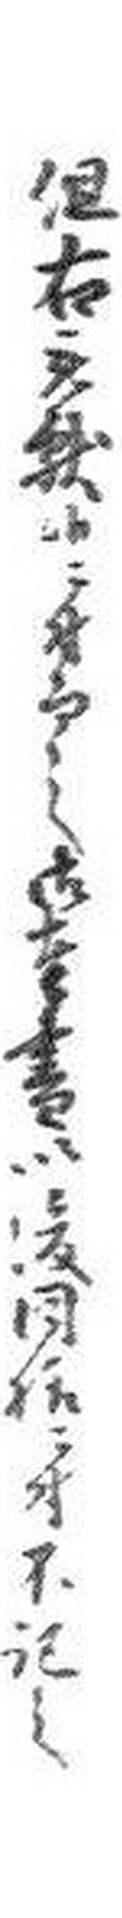但右被献候ニ付而之御奉書以後同様ニ付不記之
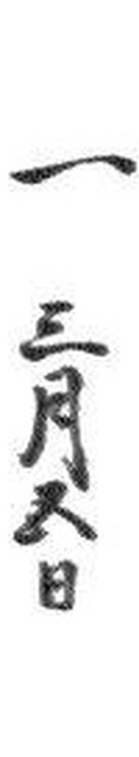一三月五日
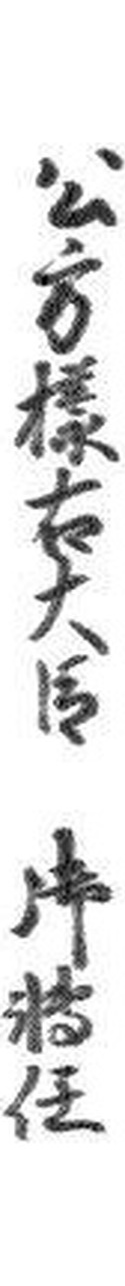公方様右大臣御転任
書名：家譜 二十三 吉品公 従宝永元年到同二年
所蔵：福井県文書館 Fukui Prefectural Archives
